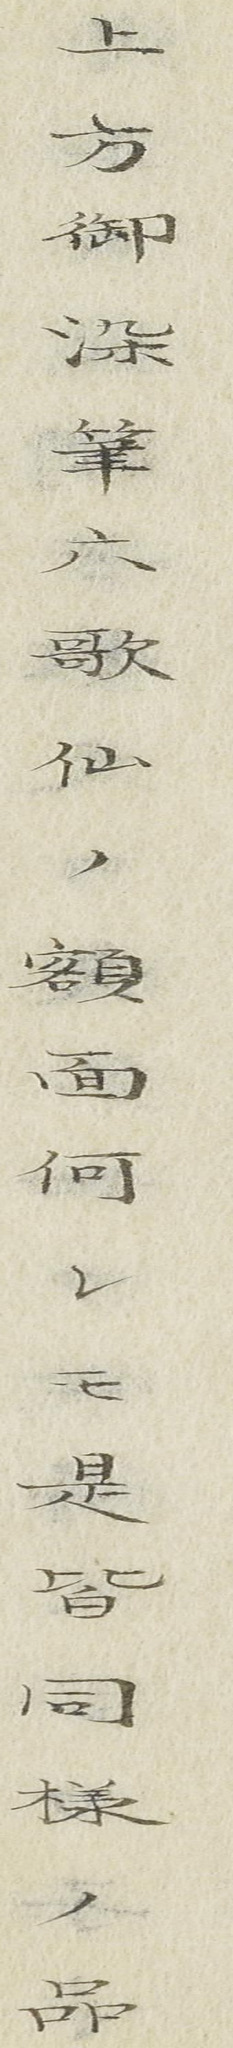上方御染筆六歌仙ノ額面何レモ是皆同様ノ品
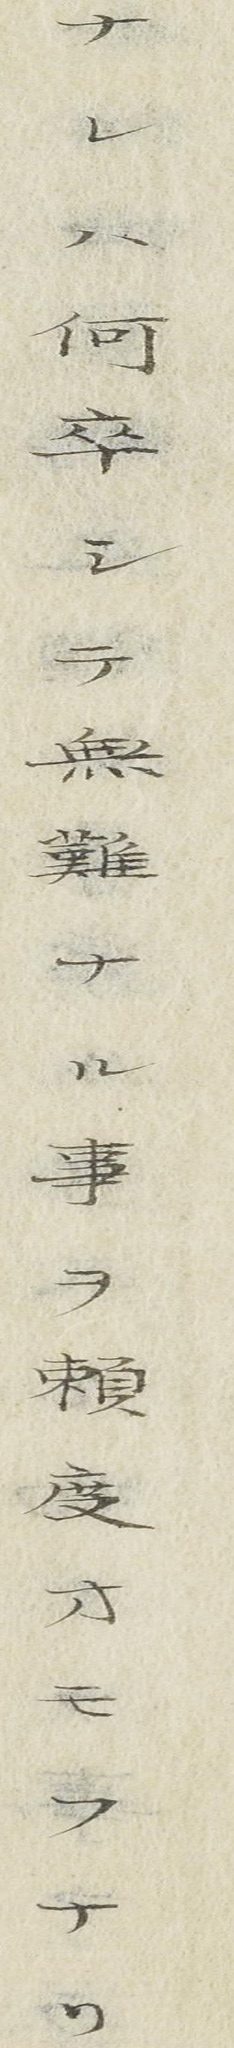ナレハ何卒シテ無難ナル事ヲ頼度オモフナリ
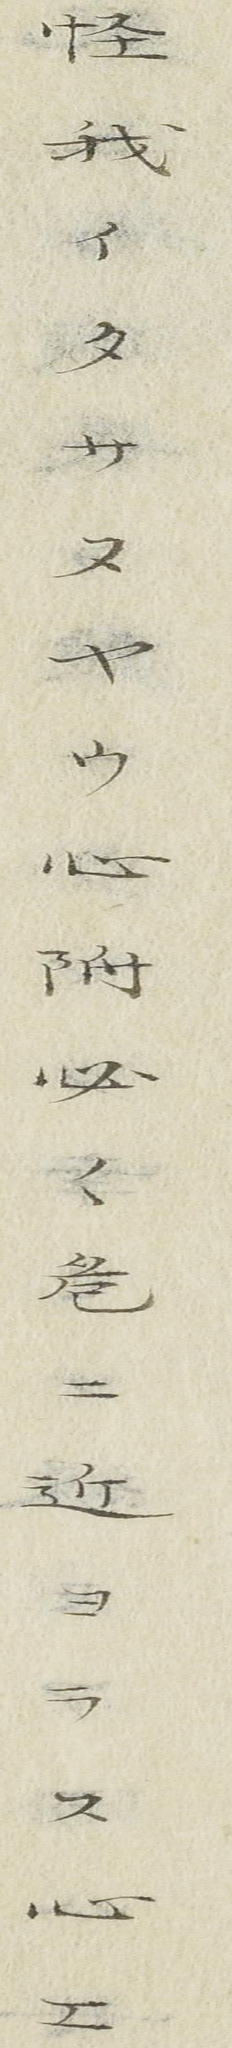怪我イタサヌヤウ心附必〱危ニ近ヨラス心エ
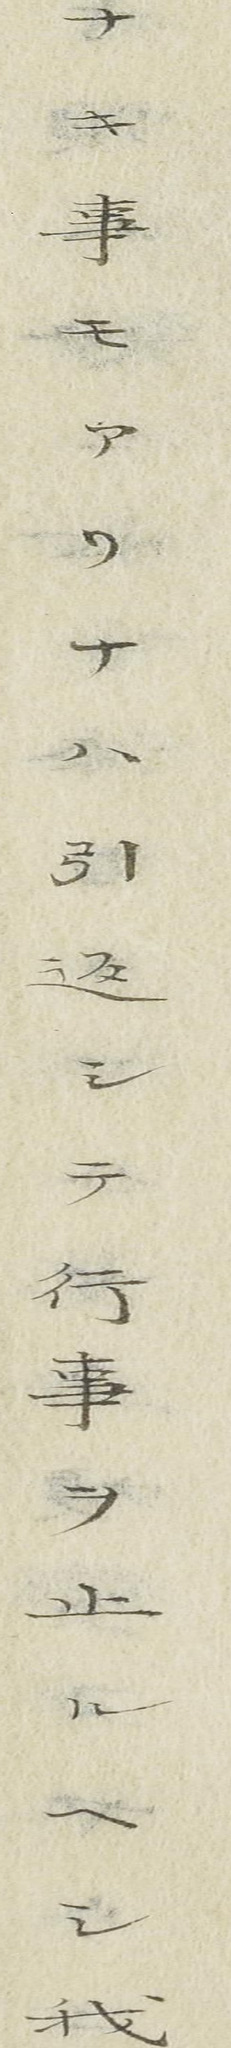ナキ事モアリナハ引返シテ行事ヲ止ルヘシ我
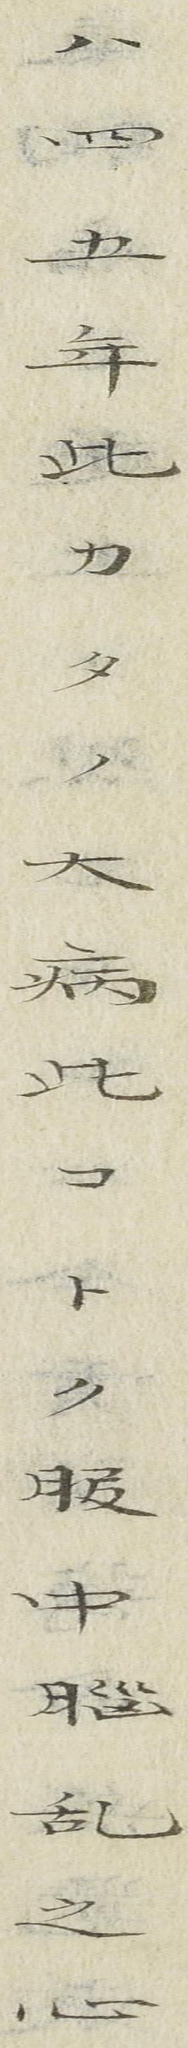ハ四五年此カタノ大病此コトク腹中能乱之心

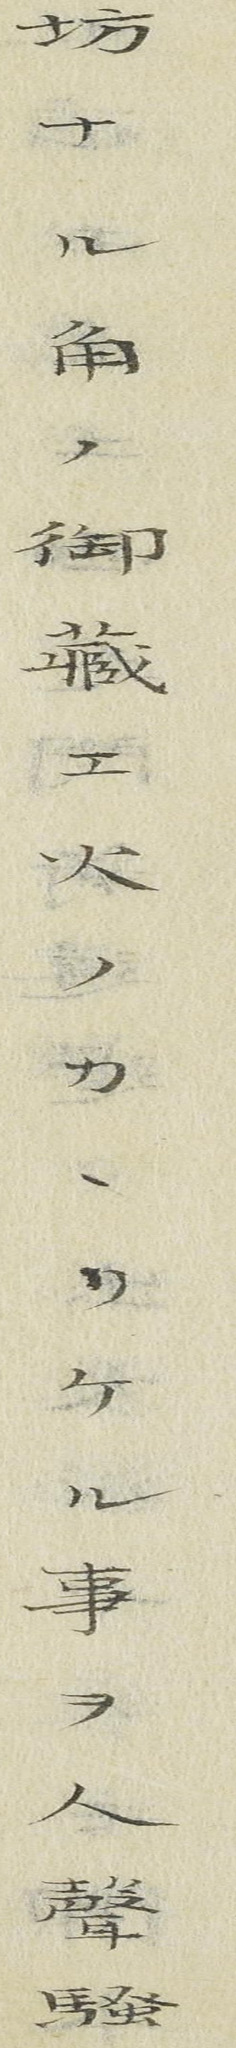坊ナル角ノ御蔵エ火ノカヽリケル事ヲ人声騒
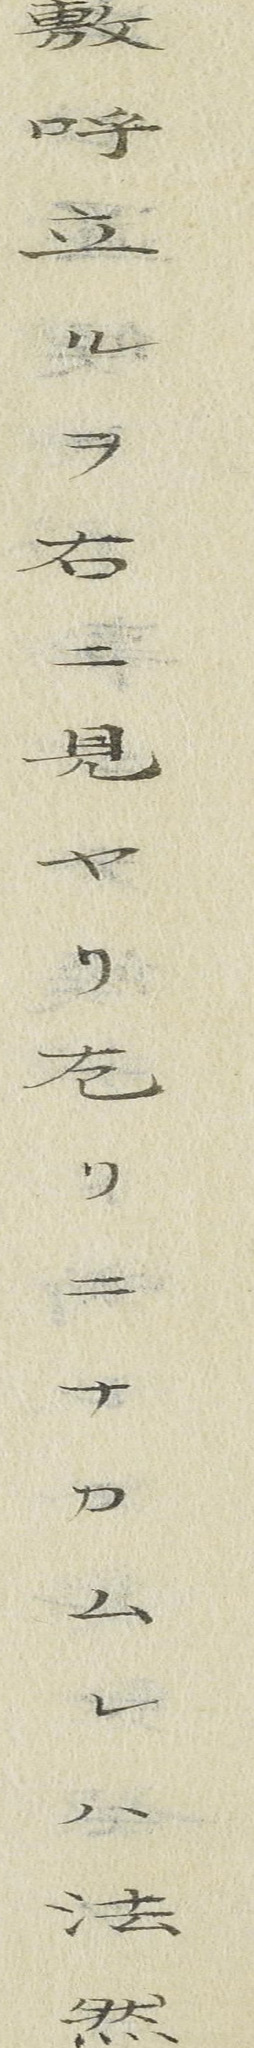敷呼立ルヲ右ニ見ヤリ左リニナカムレハ法然
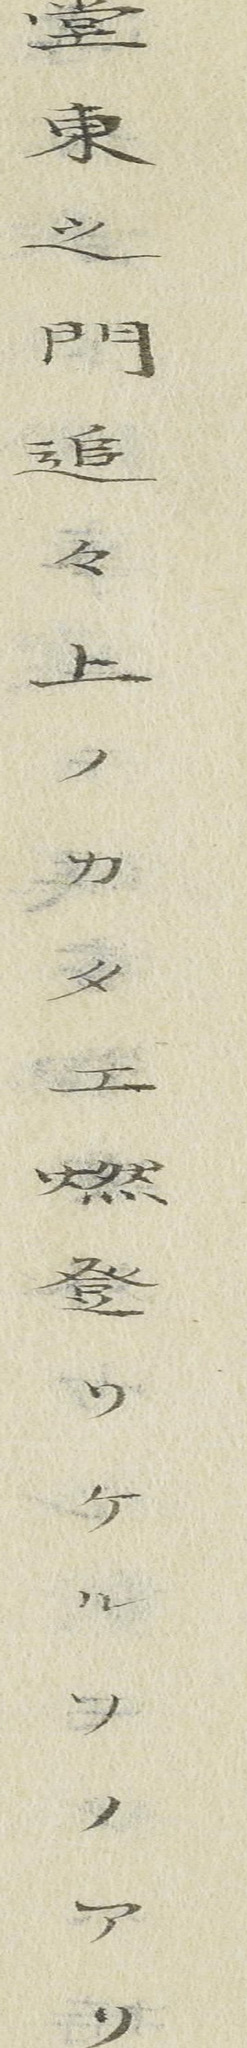堂東之門追々上ノカタエ燃登リケルソノアリ
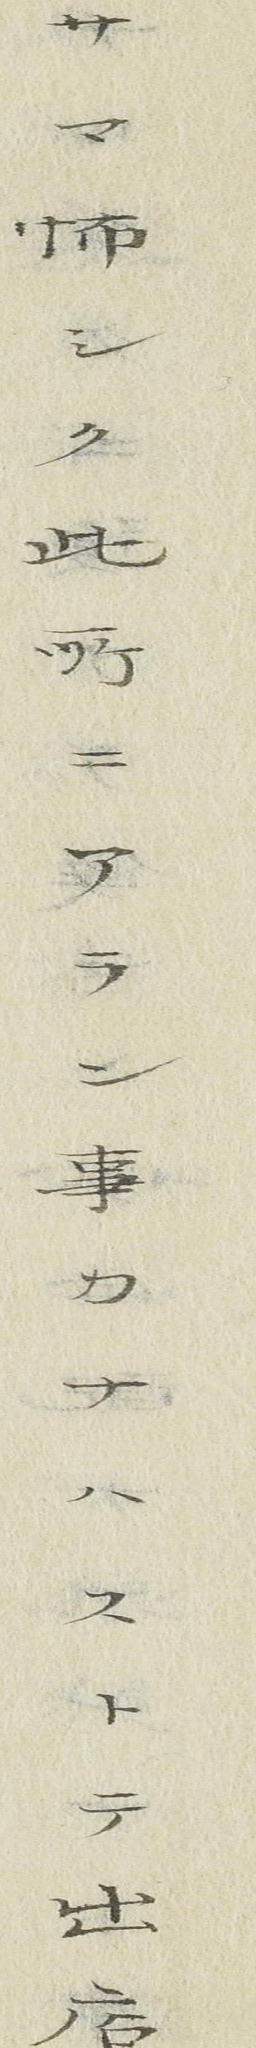サマ怖シク此所ニアラン事カナハストテ出店
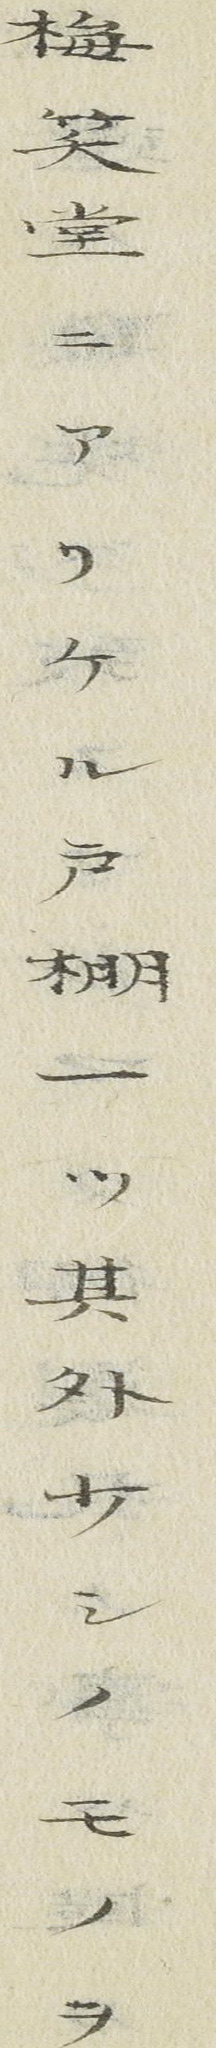梅笑堂ニアリケル戸棚一ツ其外少シノモノヲ
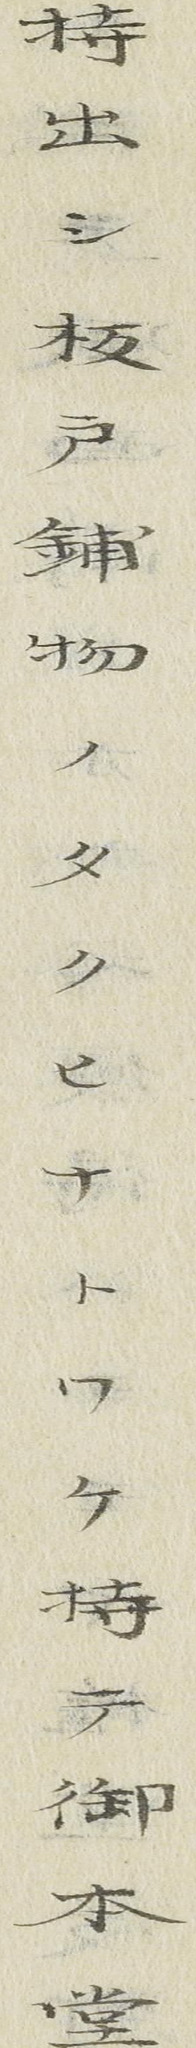持出シ板戸敷物ノタクヒナトワケ持テ御本堂
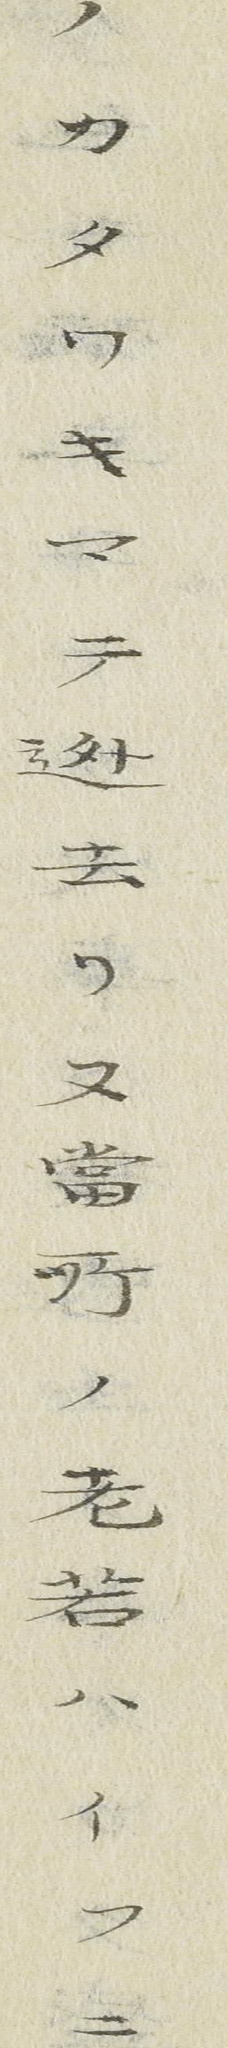ノカタワキマテ迯去リヌ当所ノ老若ハイフニ
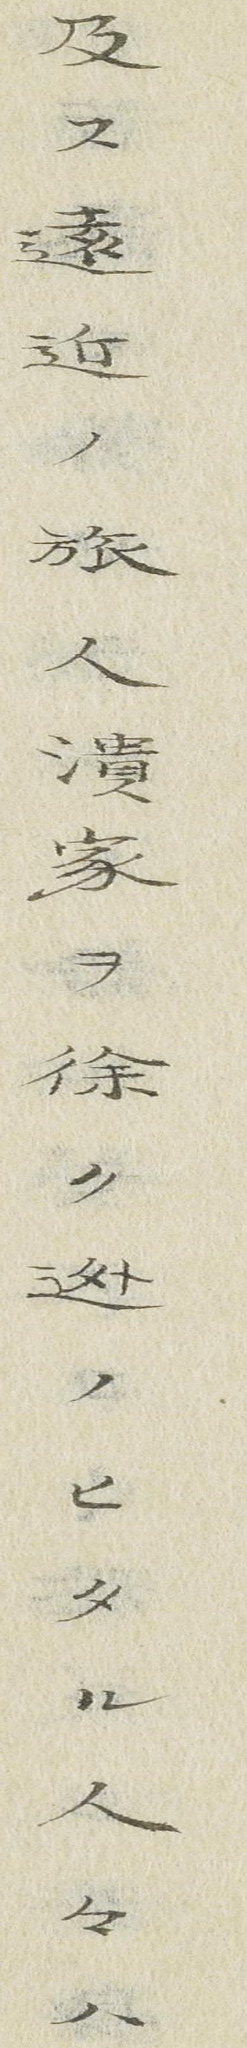及ス遠近ノ旅人潰家ヲ徐ク迯ノヒタル人々ハ
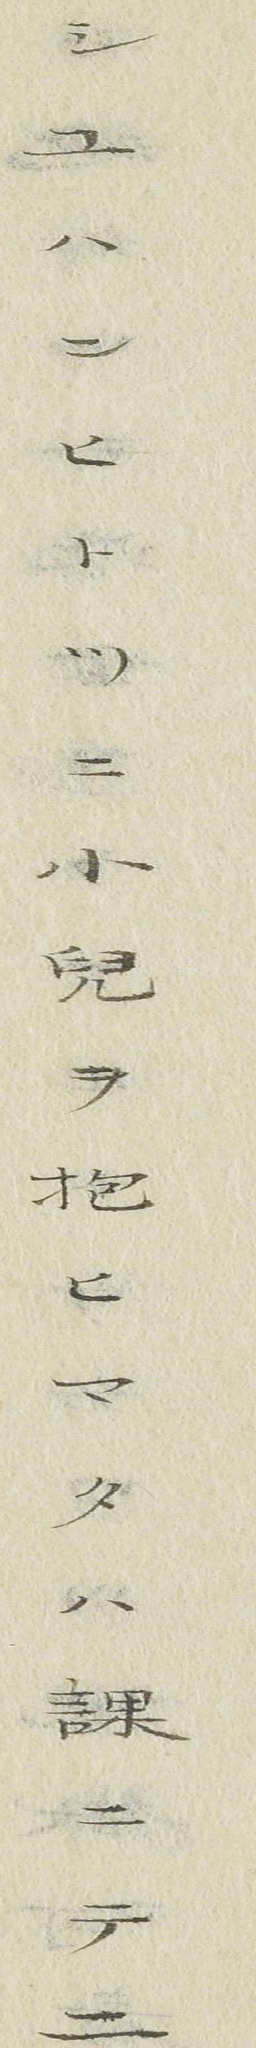シユハンヒトツニ小児ヲ抱ヒマタハ課ニテニ
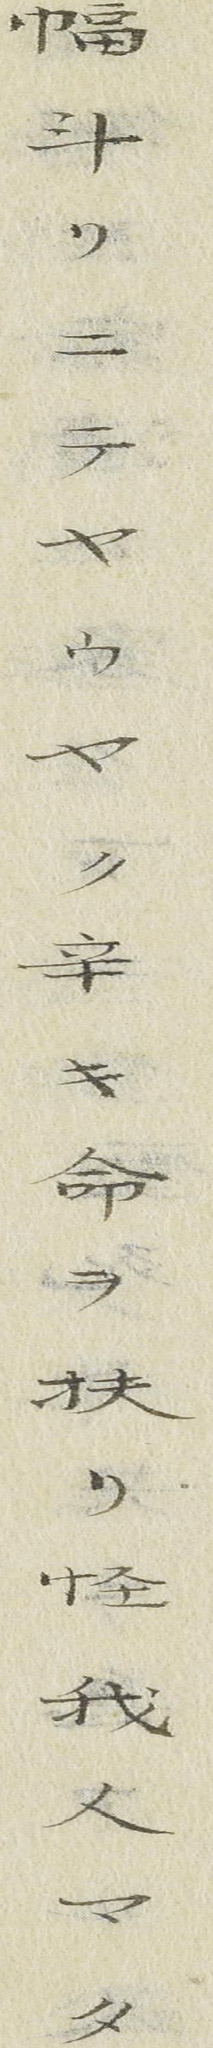幅斗リニテヤウヤク辛キ命ヲ扶リ怪我人マタ
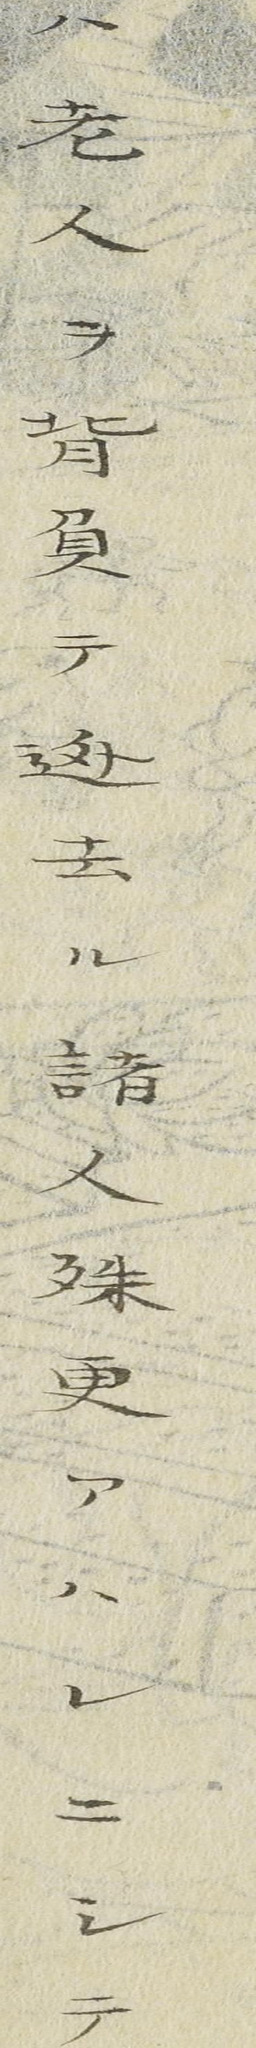ハ老人ヲ背負テ迯去ル諸人殊更アハレニシテ
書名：地災撮要　地震之部　巻ノ二
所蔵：東京大学地震研究所図書室 Earthquake Research Institute Library, The University of Tokyo, JAPAN
